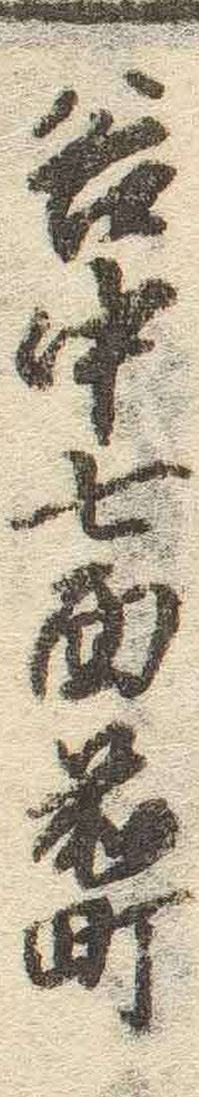谷中七面前町
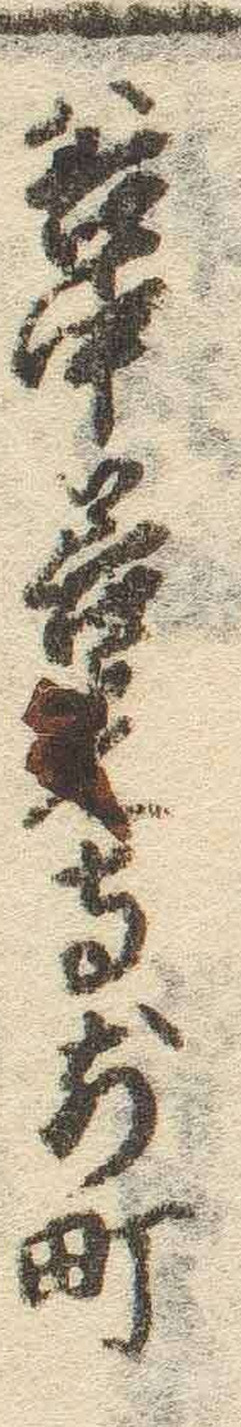谷中善光寺前町
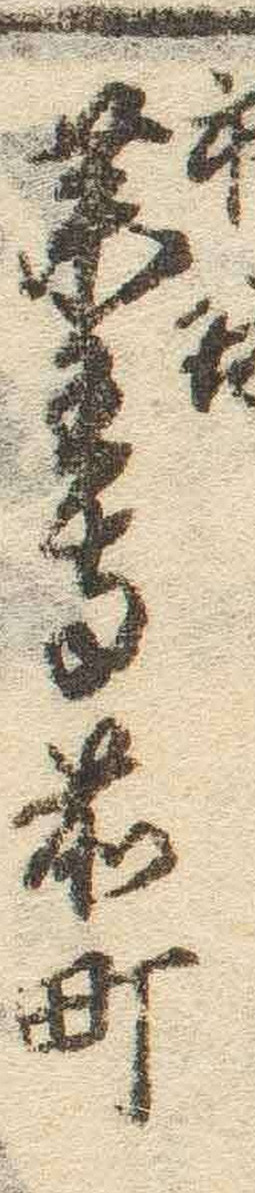薬王寺前町
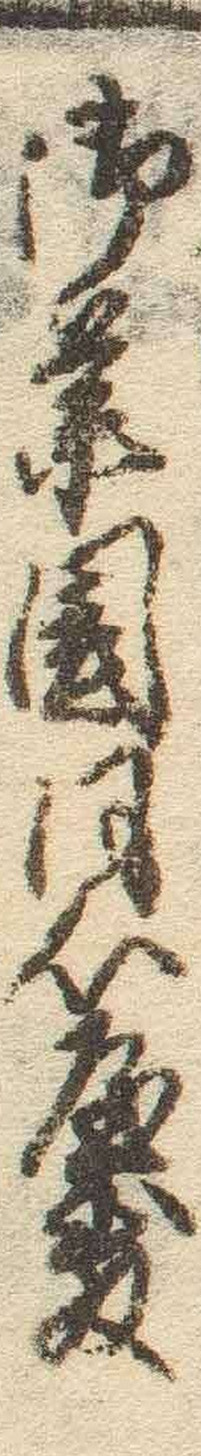御薬園同心屋敷
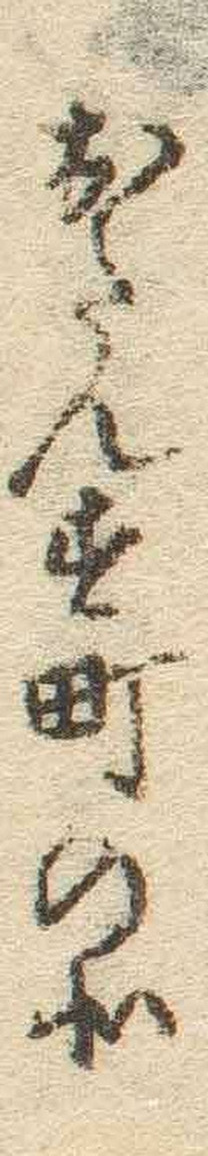おたんす町の北
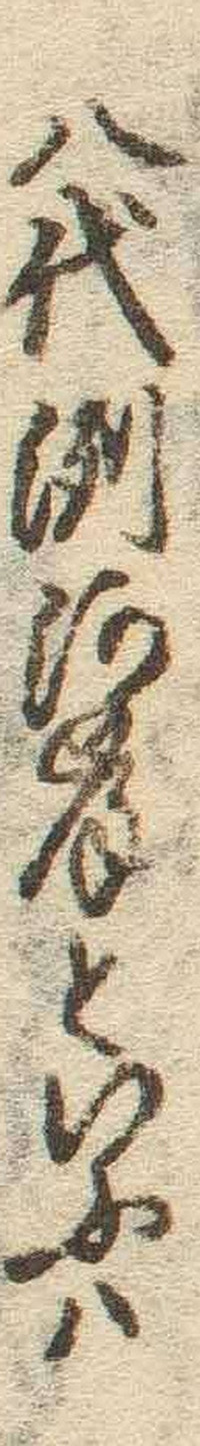八代洲河岸といふは
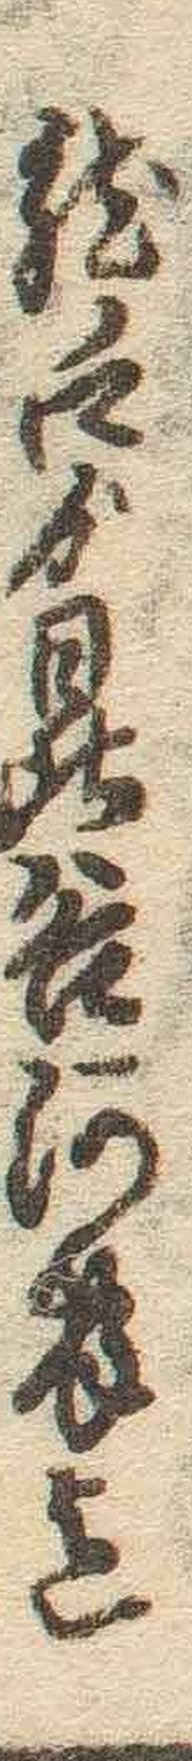龍ノ口ゟ日比谷河岸迄
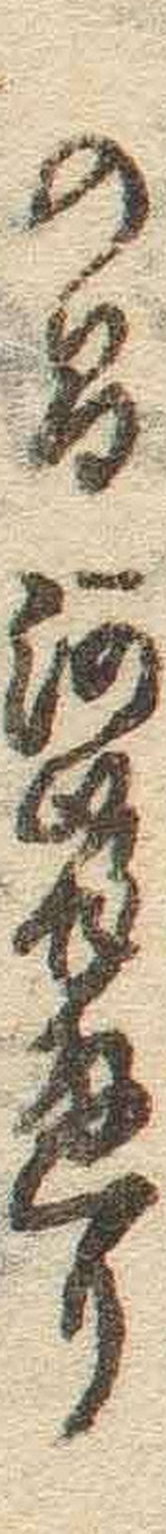の間河岸通り
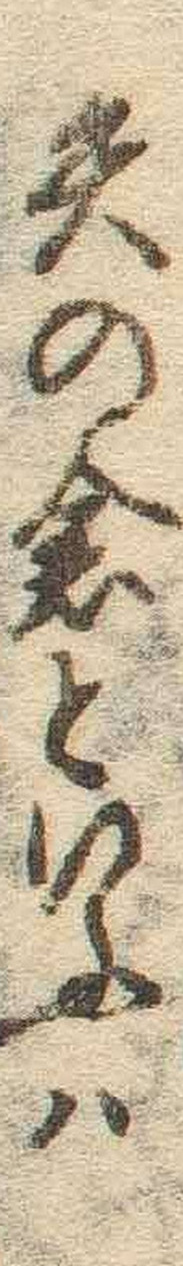矢の倉といふは
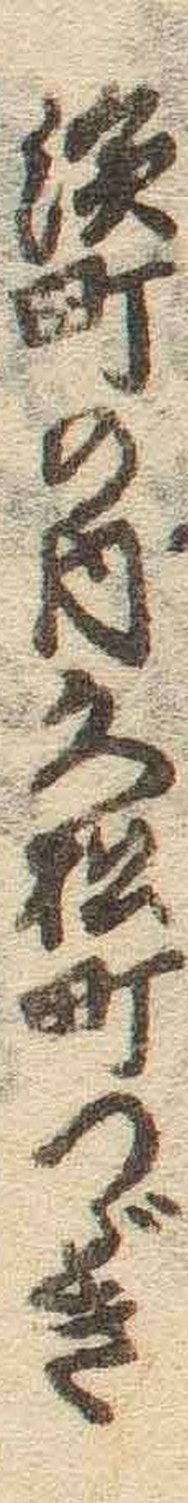浜町の内久松町つゞき
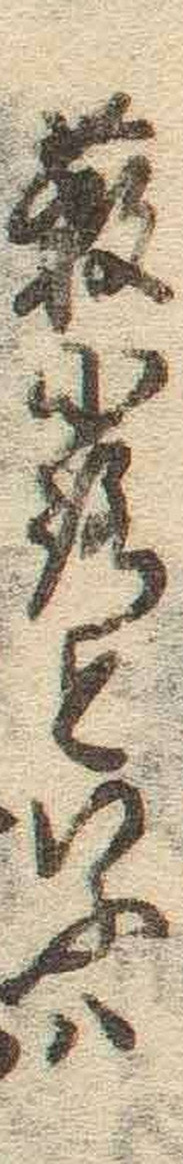薮小路といふは
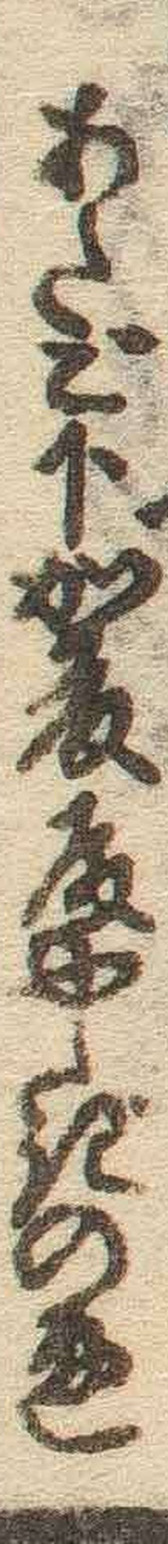あたご下加藤殿やしきの通

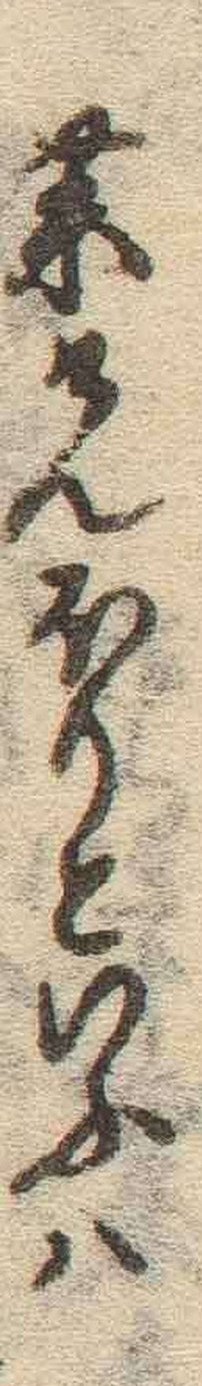薬けんほりといふは
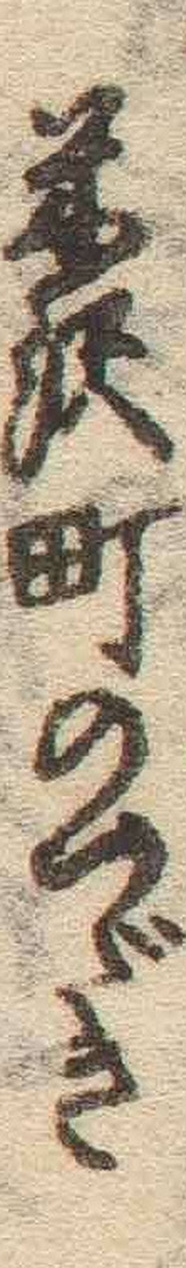米沢町のつゞき
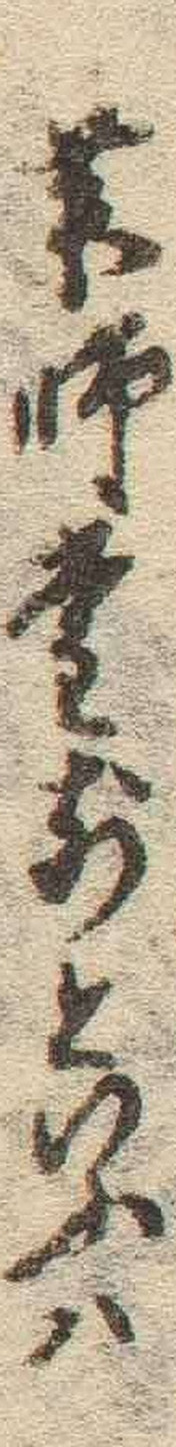薬師堂前といふは
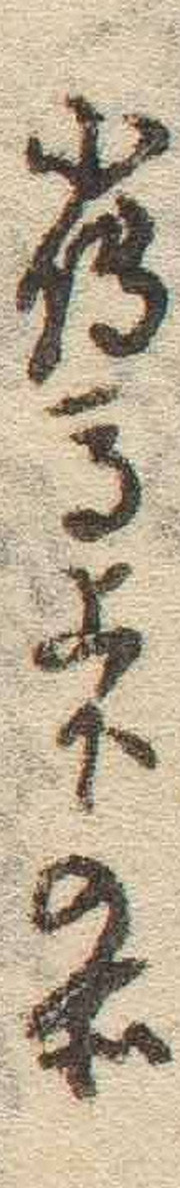小伝馬上下の所
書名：江戸町独案内
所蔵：東京学芸大学附属図書館 国文学研究資料館
